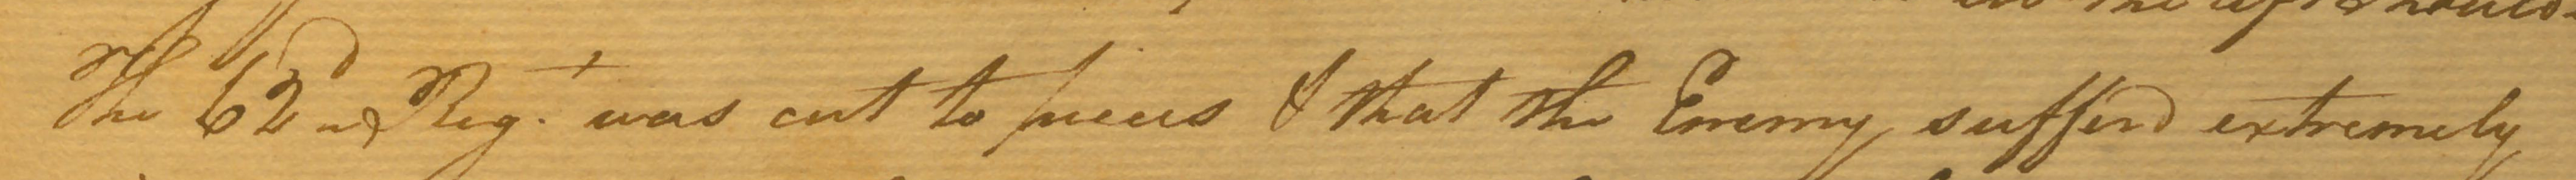The 62^nd Reg^t. was cut to pieces & that the Enemy sufferd extremely
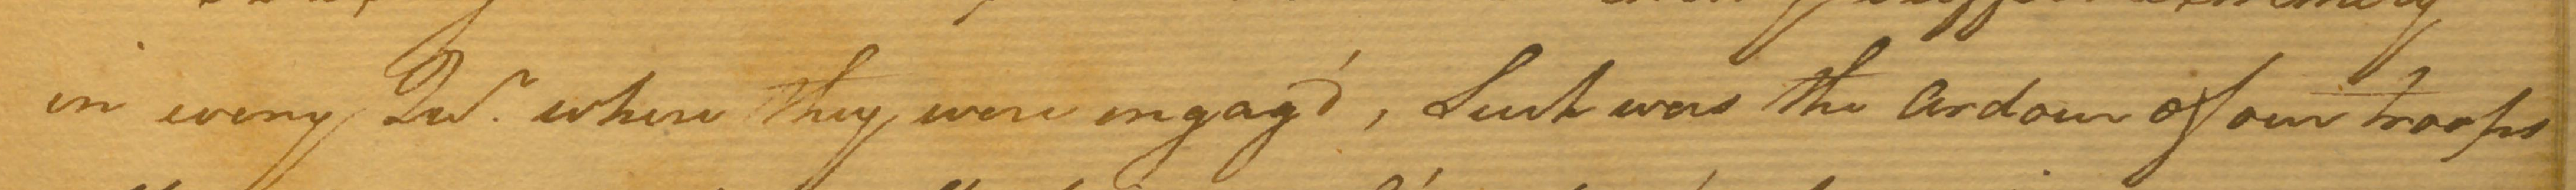in every Qu^r. where they were engag'd. Such was the ardour of our troops
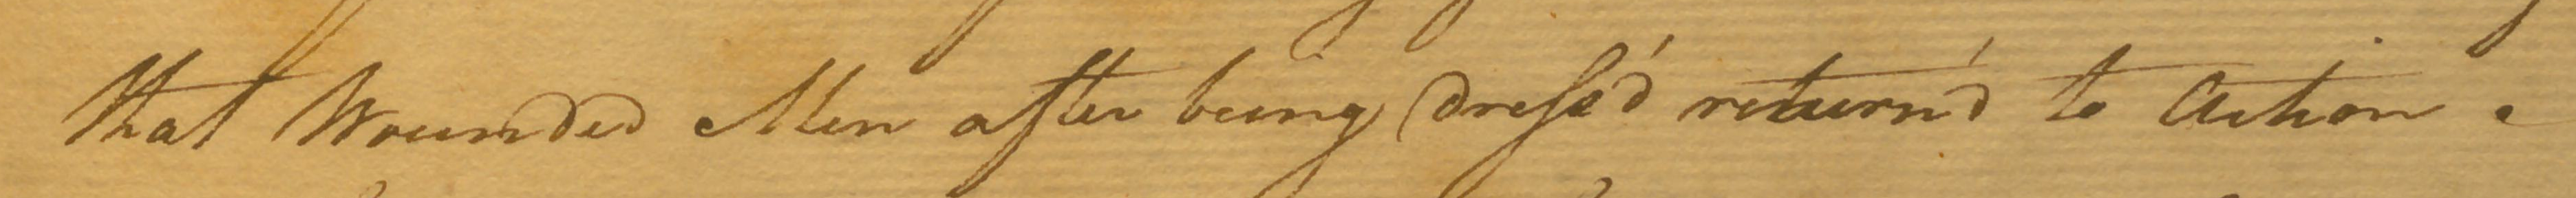that Wounded Men after being dress'd return'd to Action.
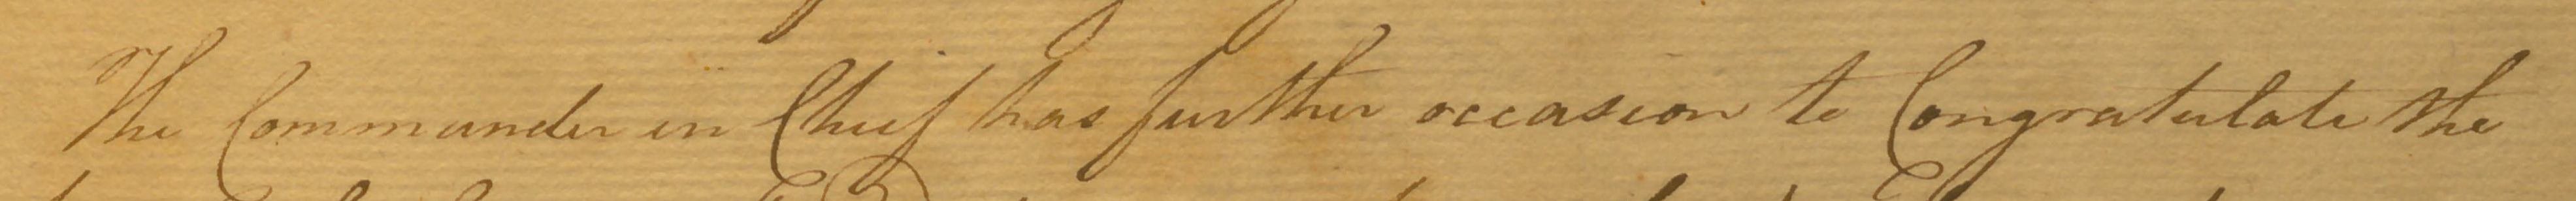The Commander in Chief has further occasion to Congratulate the
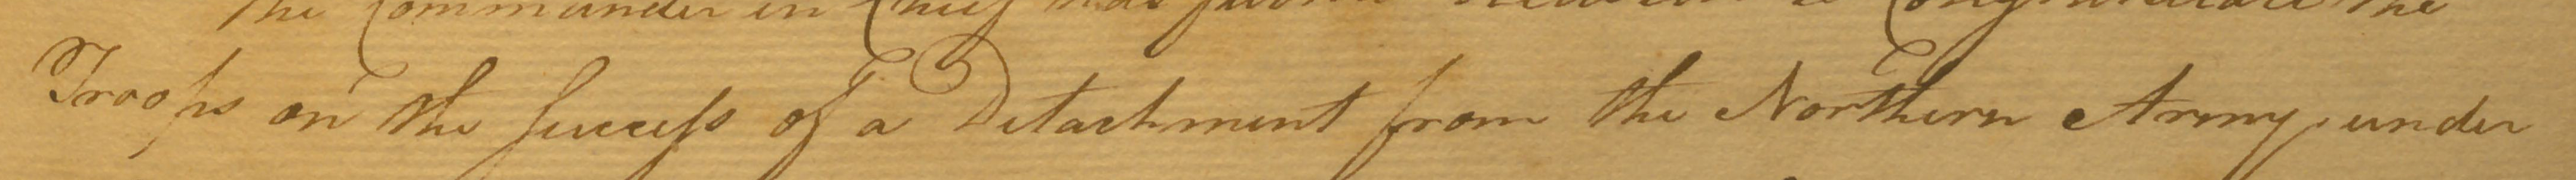Troops on the Success of a Detachment from the Northern Army under
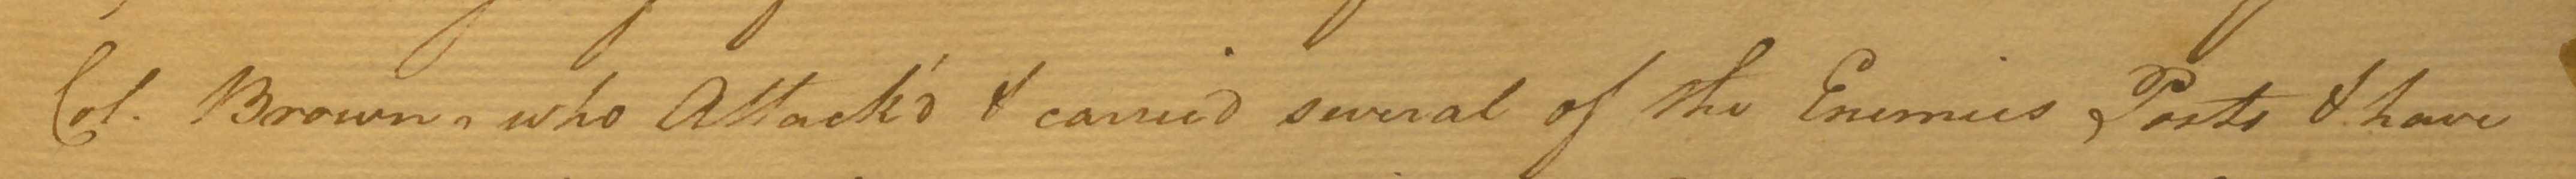Col. Brown who attack'd & carried several of the Enemies Posts & have
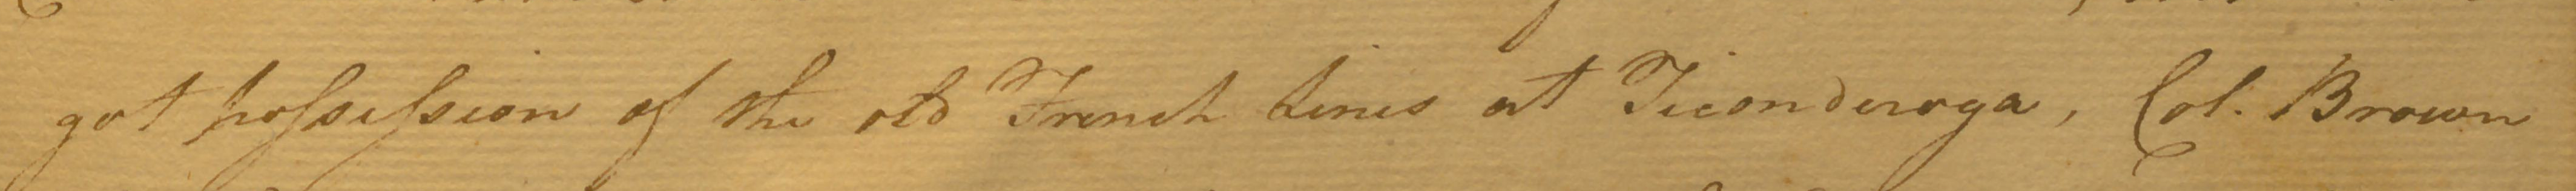got possession of the old French Lines at Ticonderoga, Col. Brown
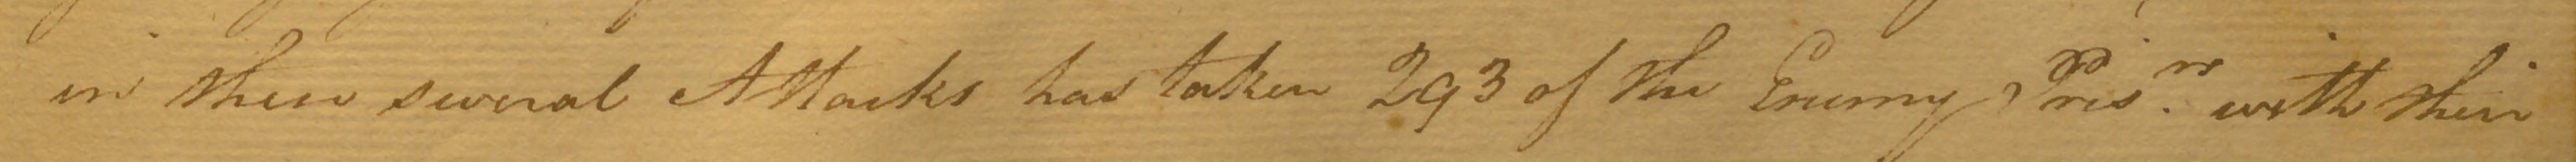in these several Attacks has taken 293 of the Enemy Pris^rs. with their
